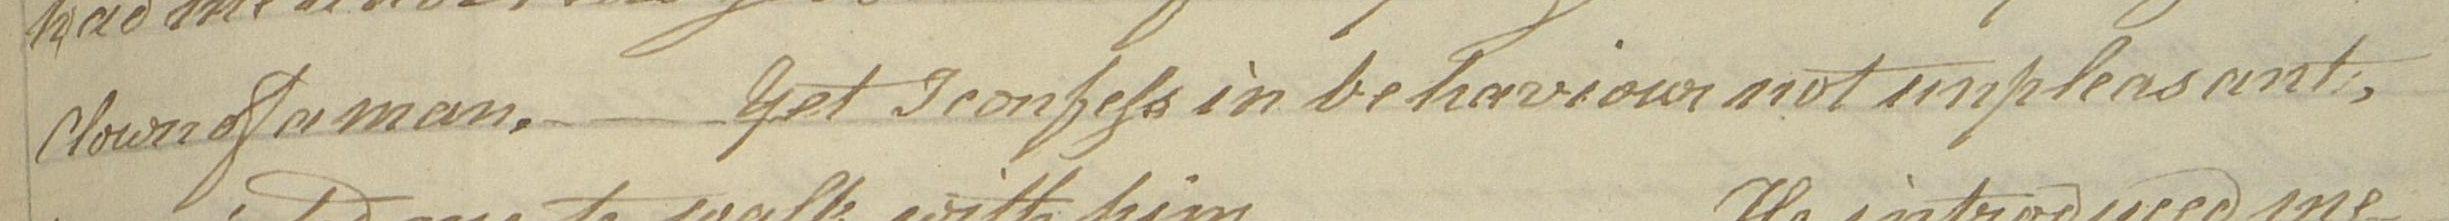Clown of a man, Get I confess in behaviour not unpleasant,
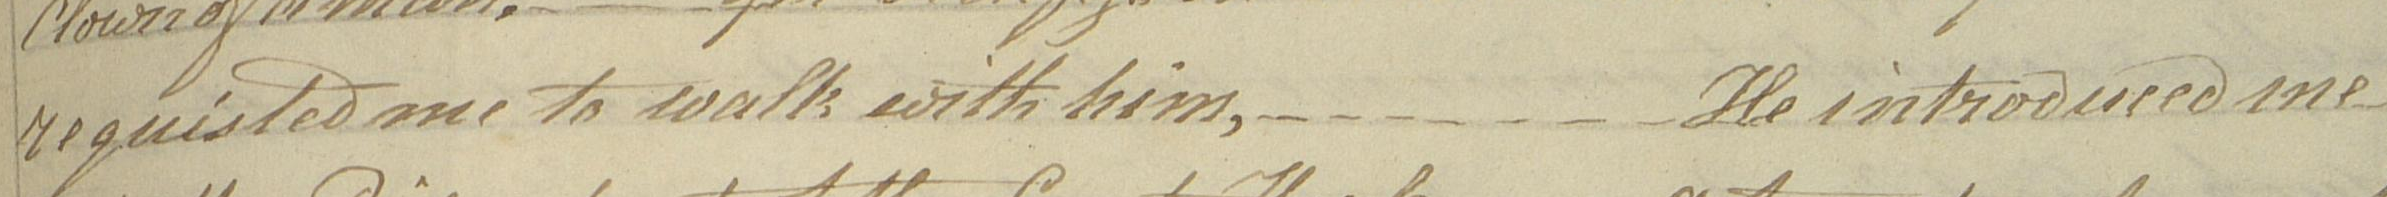requisted me to walk with him, He introduced me
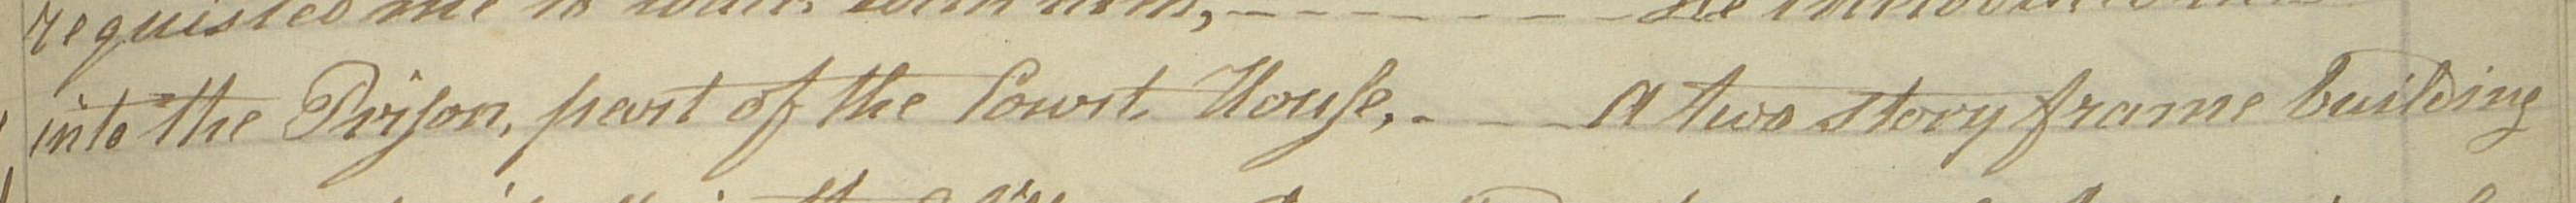into the Prison part of the Court House.- A Two story frame building
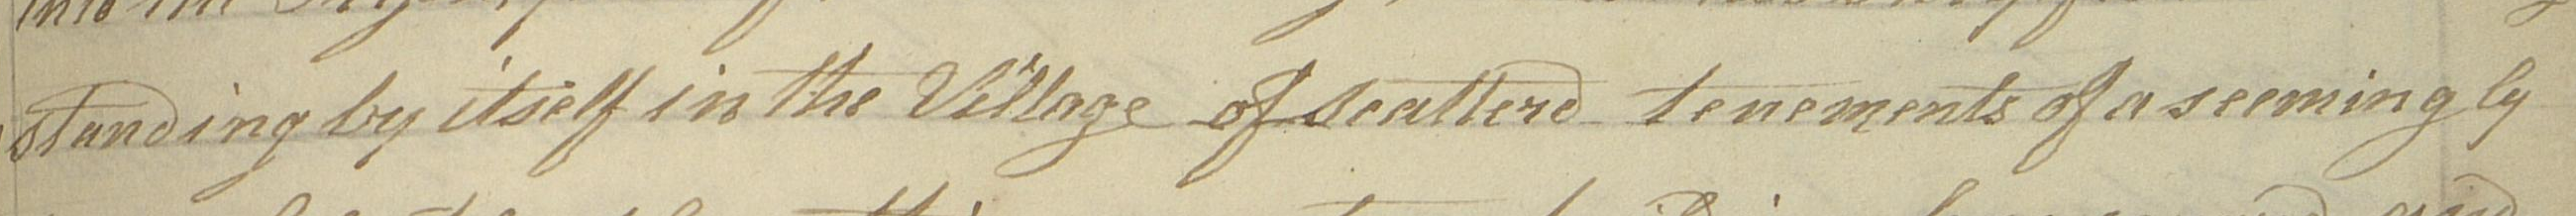standing by itself in the Village of scatterd tenements of a seemingly
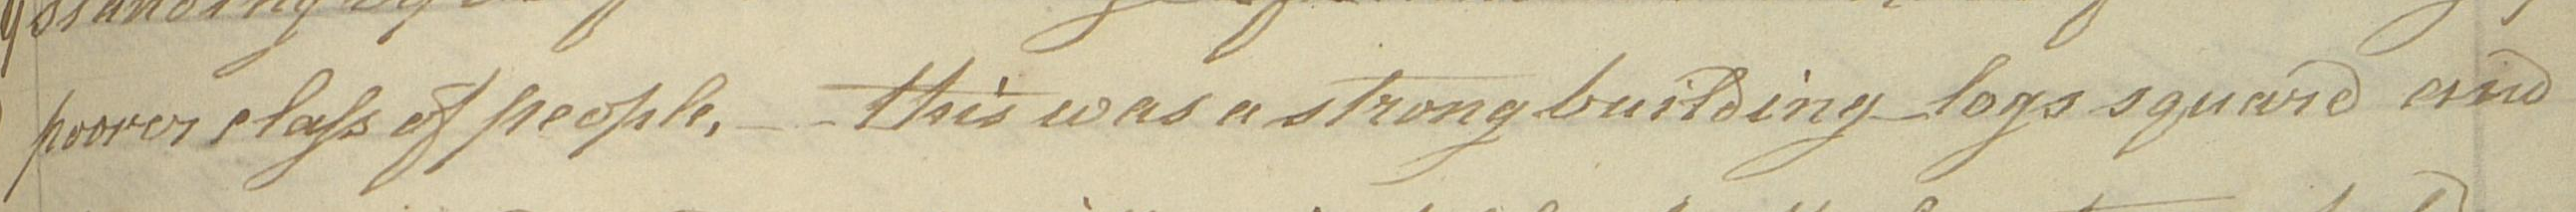poorer class of people. This was a strong building logs squard and
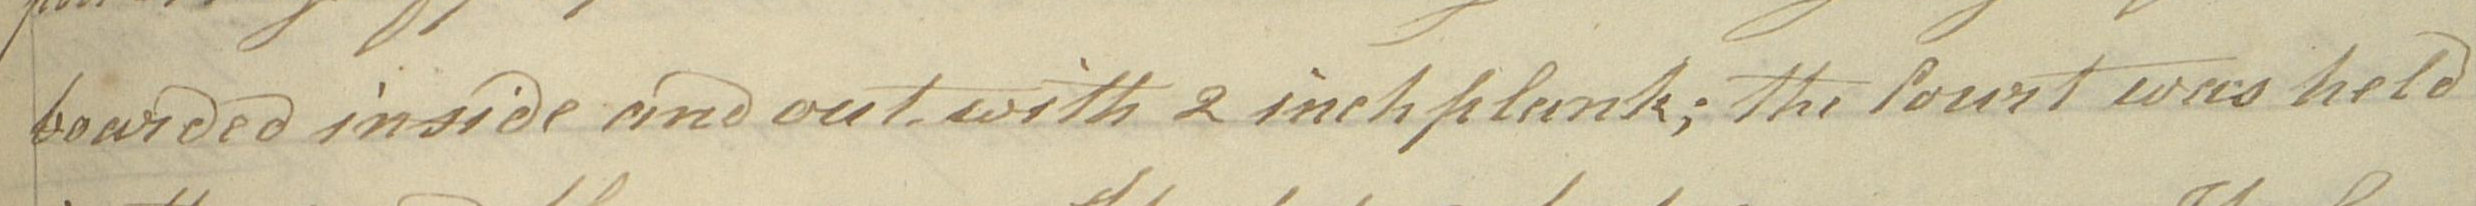boarded inside and out with 2 inch plank; the Court was held
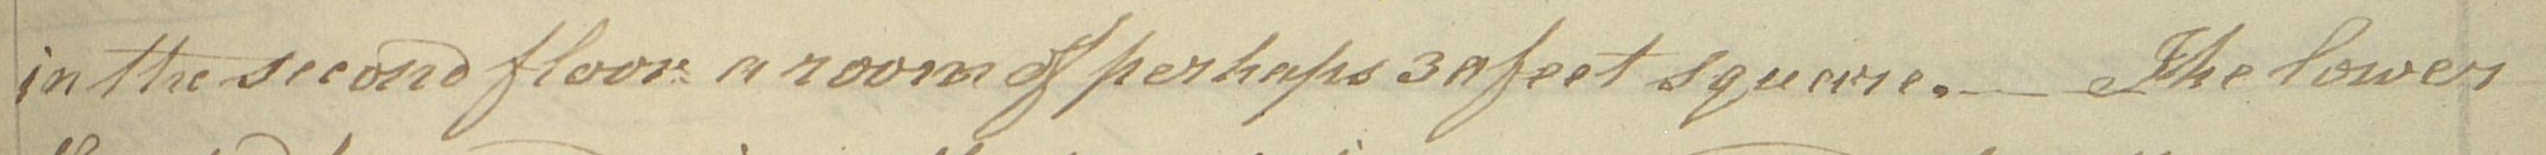in the second floor a room of perhaps 3 a feet square. The lower
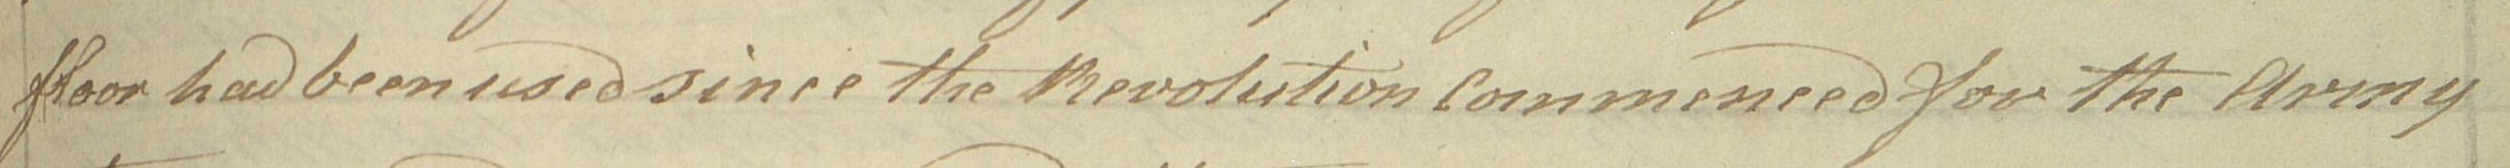floor had been used since the Revolution commenced for the Army
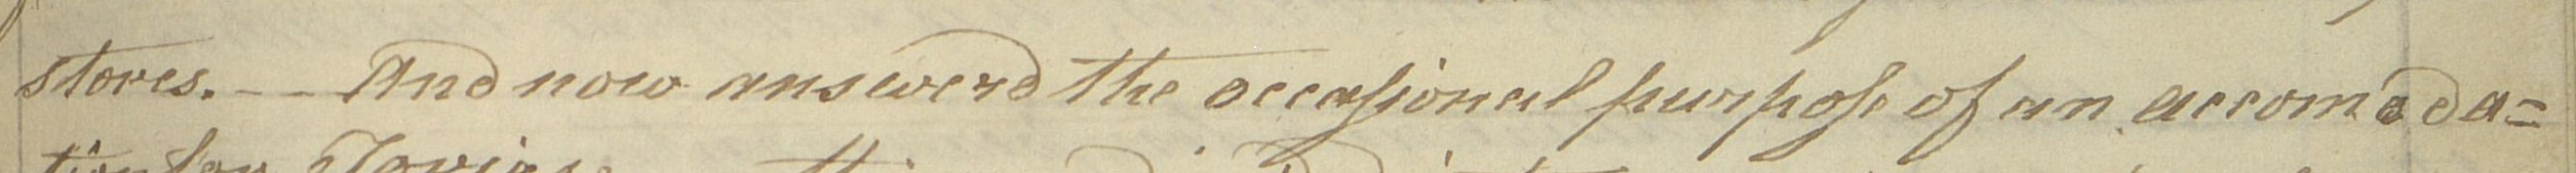stores. And now answerd the occasional purpose of an accomoda-
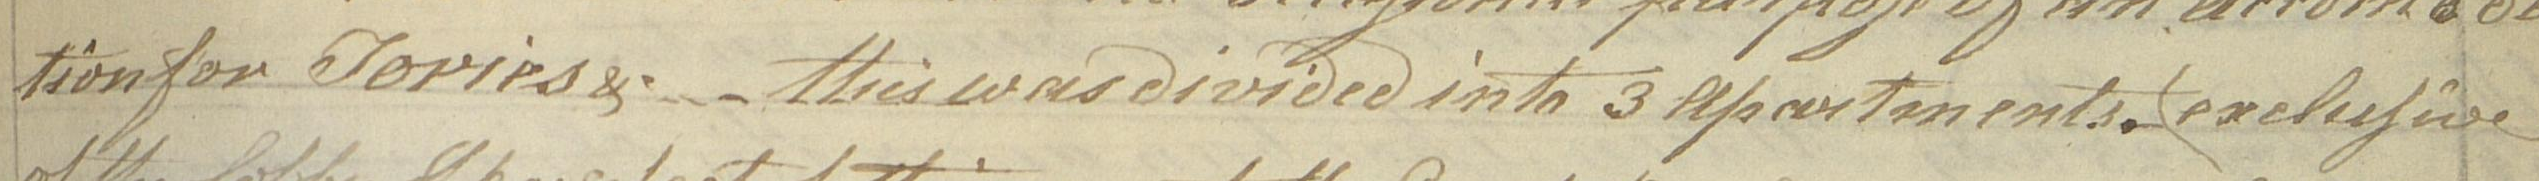-tion for Tories &^c this was divided into 3 Apartments (exclusive
